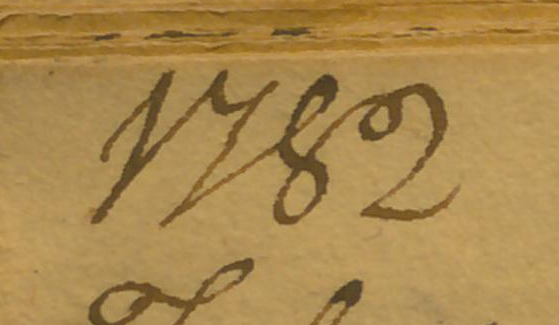1782
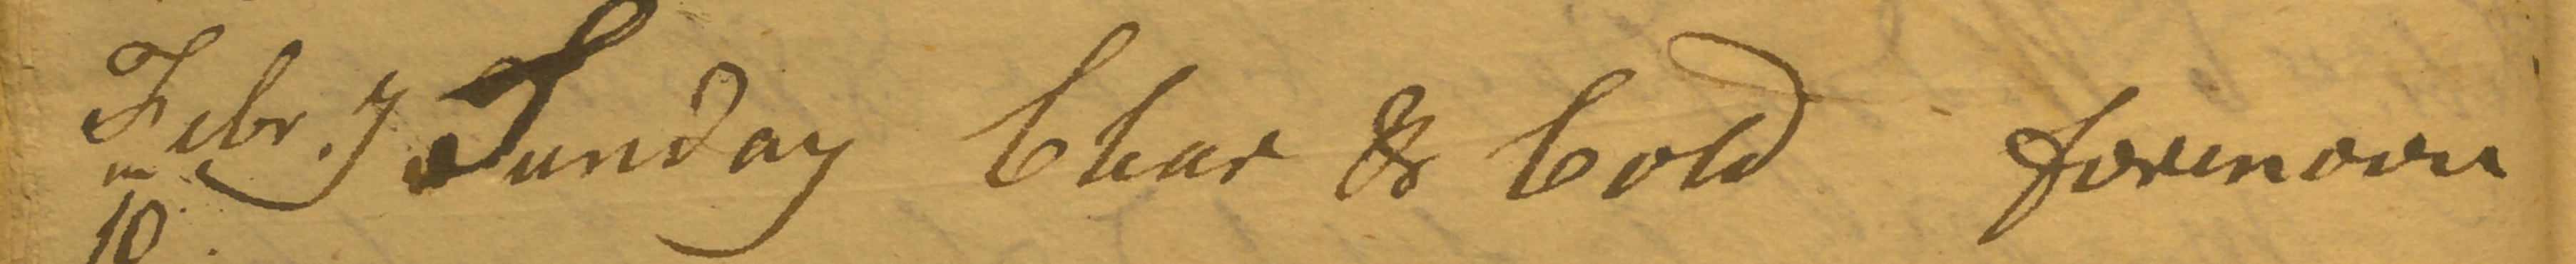Febr^y. Sunday Clear & Cold forenoon
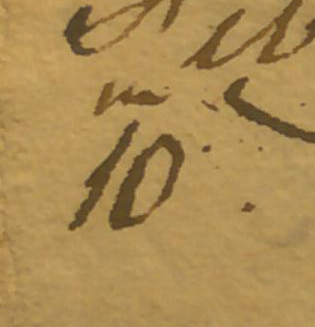10^th
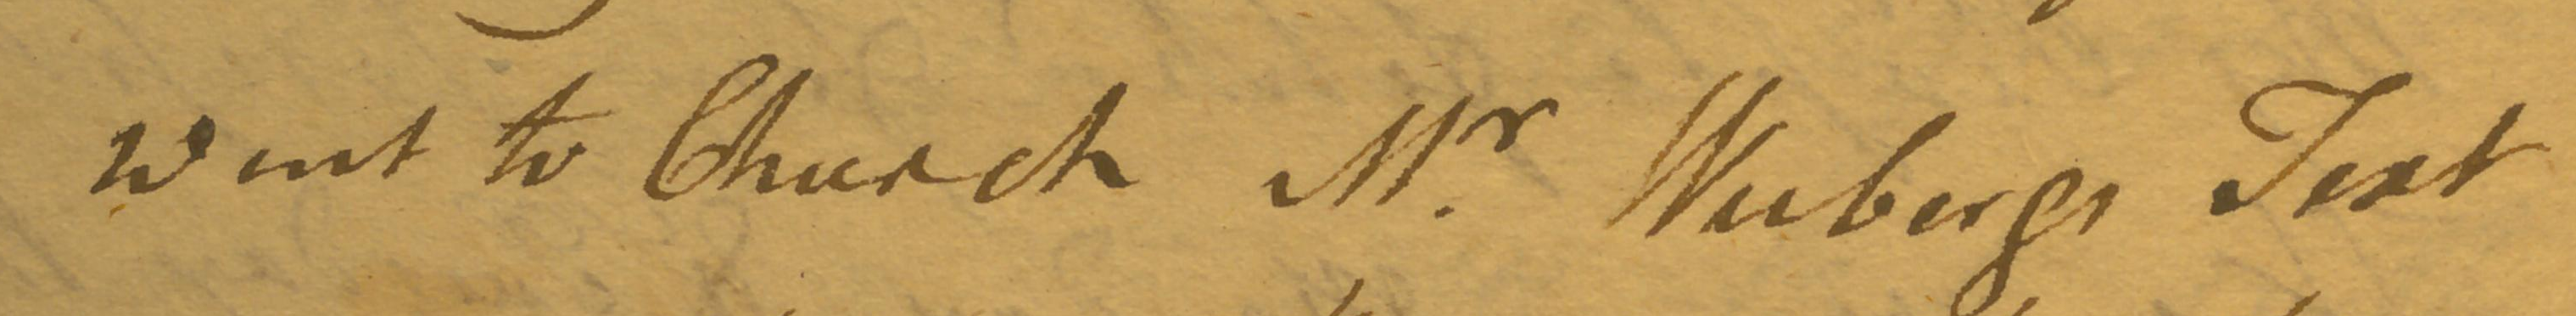went to Church M^r. Weibergs Text
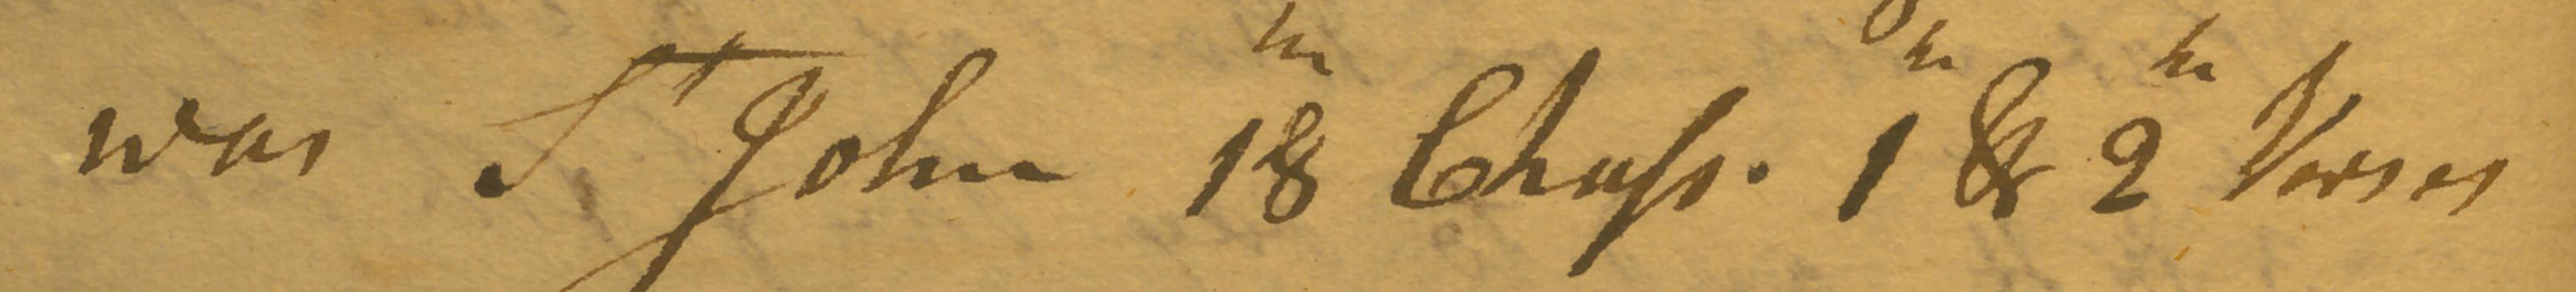was S^t. John 18^th Chap. 1^h & 2^h Verses
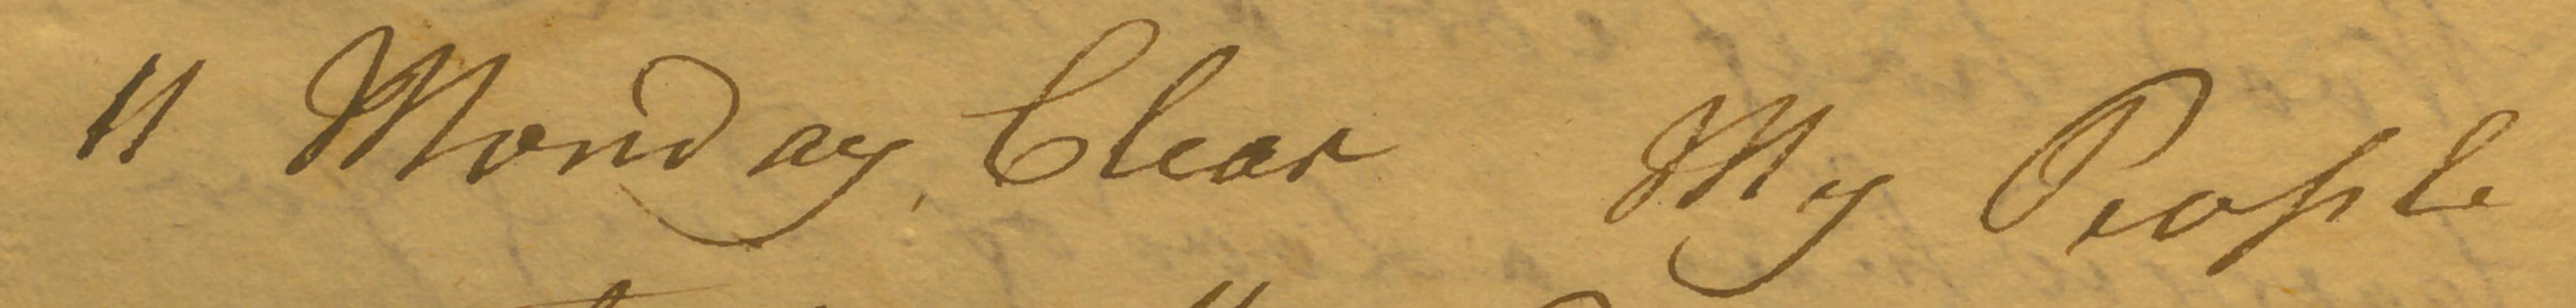11 Monday Clear My People
